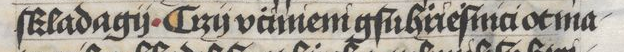ſkladagij.Cizij vċinieni gſu hṙieẛníci ot ma¬
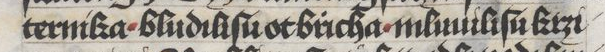terníka.bludiliſu ot bṙicha.mluuiliſu krzi¬
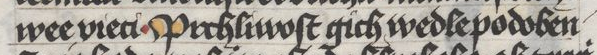wee vieci.Prchliwoſt gich wedle podoben¬
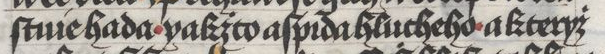ſtuíe hada.yakżto aſpida hlucheho.a kteryž
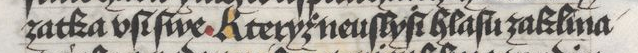zatka vſi ſwe.Kteryż neuſlyẛí hlaſu zaklina¬
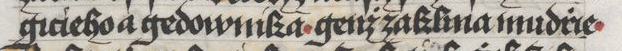gicieho a gedowníka.genż zaklina mudṙie.
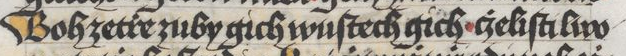Boh zetṙe zuby gich wuſtech gich.cżeliſti lwo¬
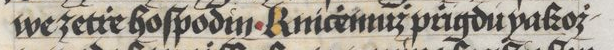we zetṙe hoſpodin.Kníċemuż pṙigdu yakoż¬
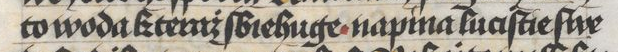to woda kteraż ſbiehuge.napína luciẛtie ſwe
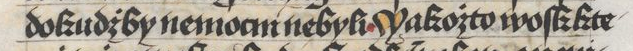dokudżby nemocní nebyli.Yakożto woſk kte¬
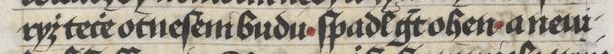ryż teċe otneſeni budu.ſpadl ḡt ohen.a neui¬
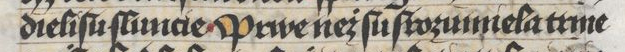dieliſu ſluncie.Prwe neż ſu ſrozumíela trníe
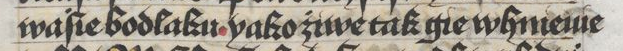waẛie bodlaku.yako żiwe tak gie whnieuie¬
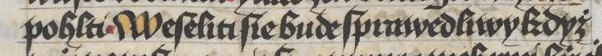pohltí.Weſeliti ſie bude ſprawedliwy kdyż
